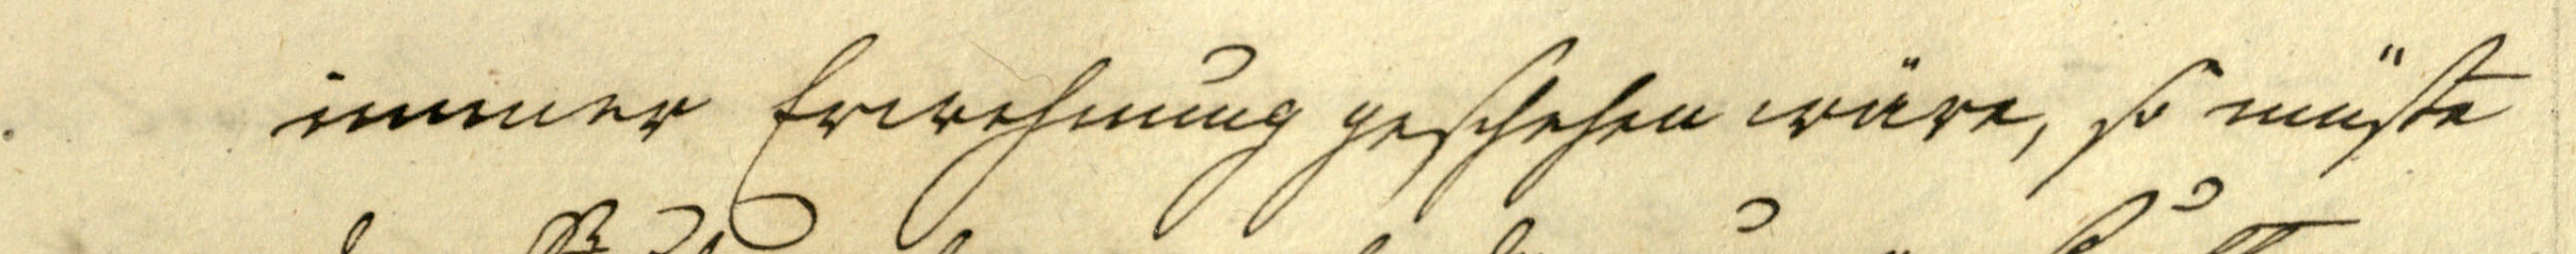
immer Erwehnung geschehen wäre, so müßte
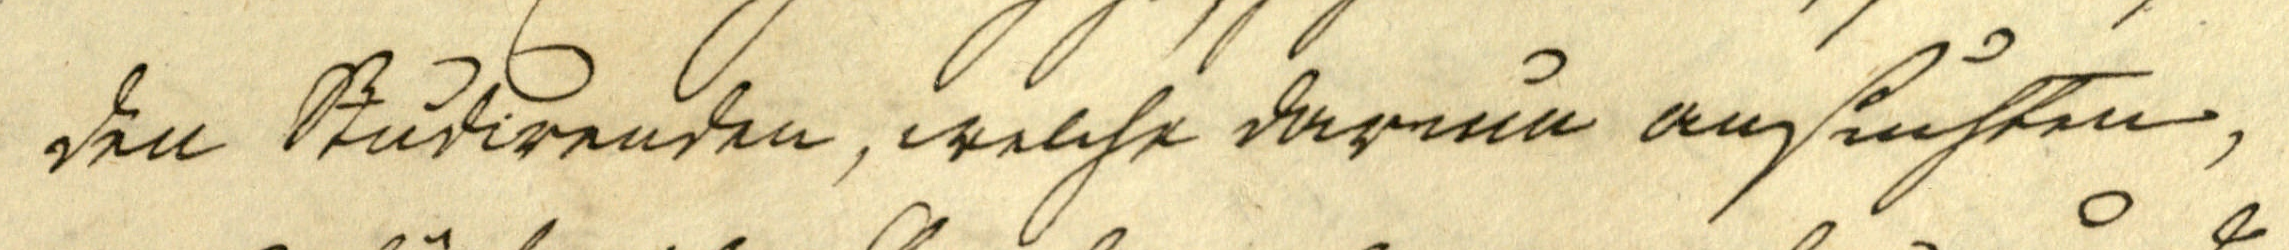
den Studirenden, welche darum ansuchten,
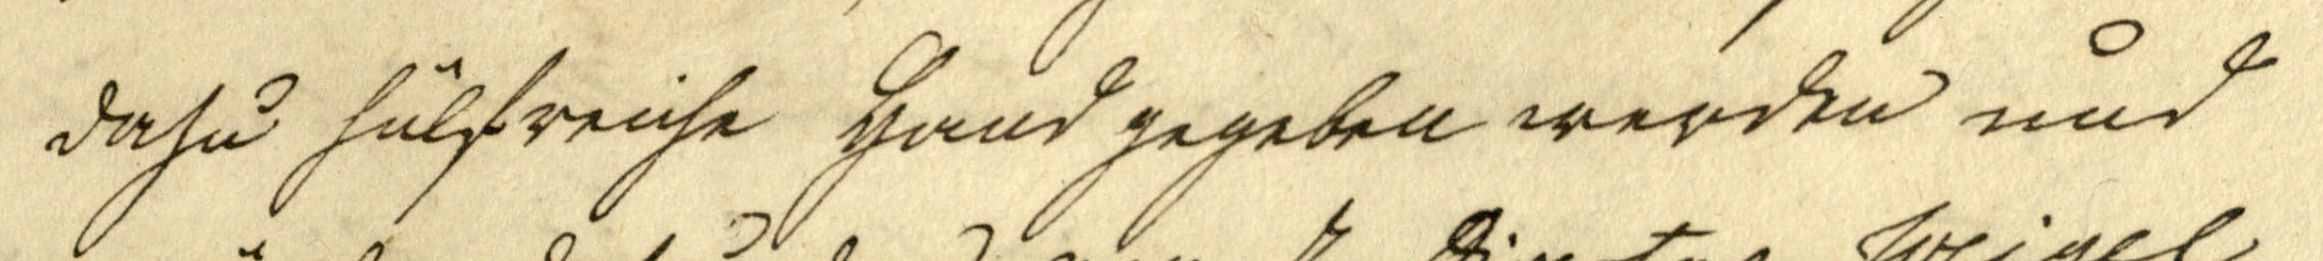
dazu hülfreiche Hand gegeben werden und
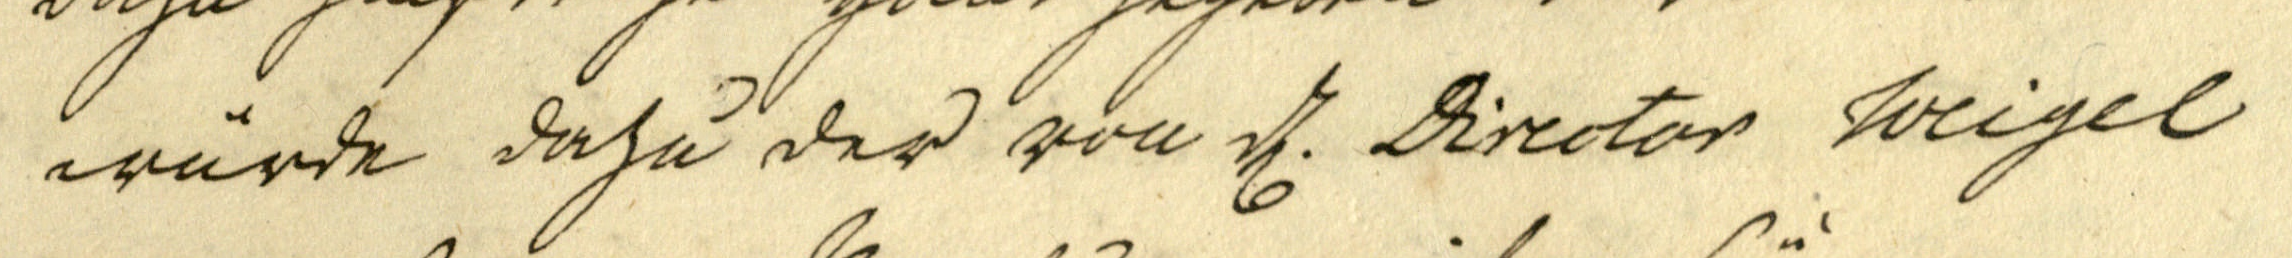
würde dazu der von dh. Director Weigel
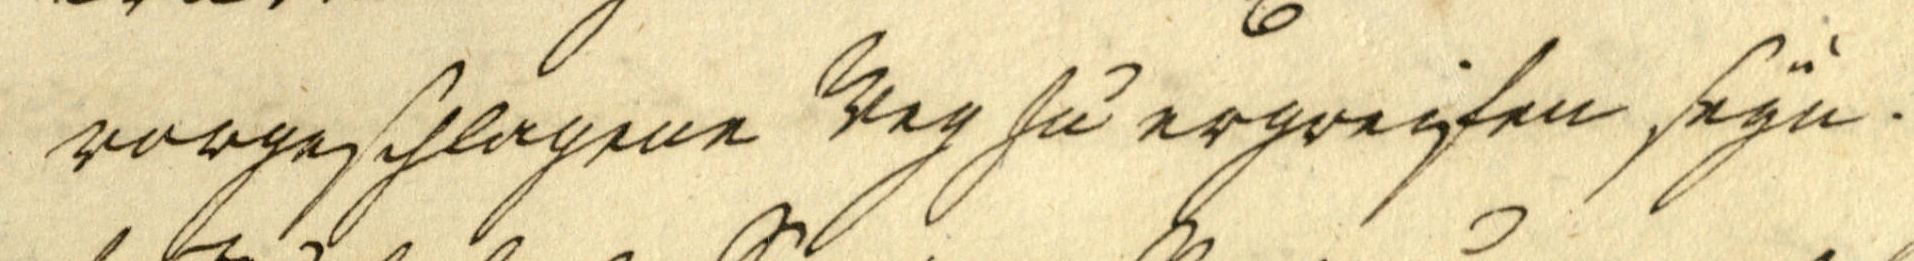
vorgeschlagene Weg zu ergreifen seyn.
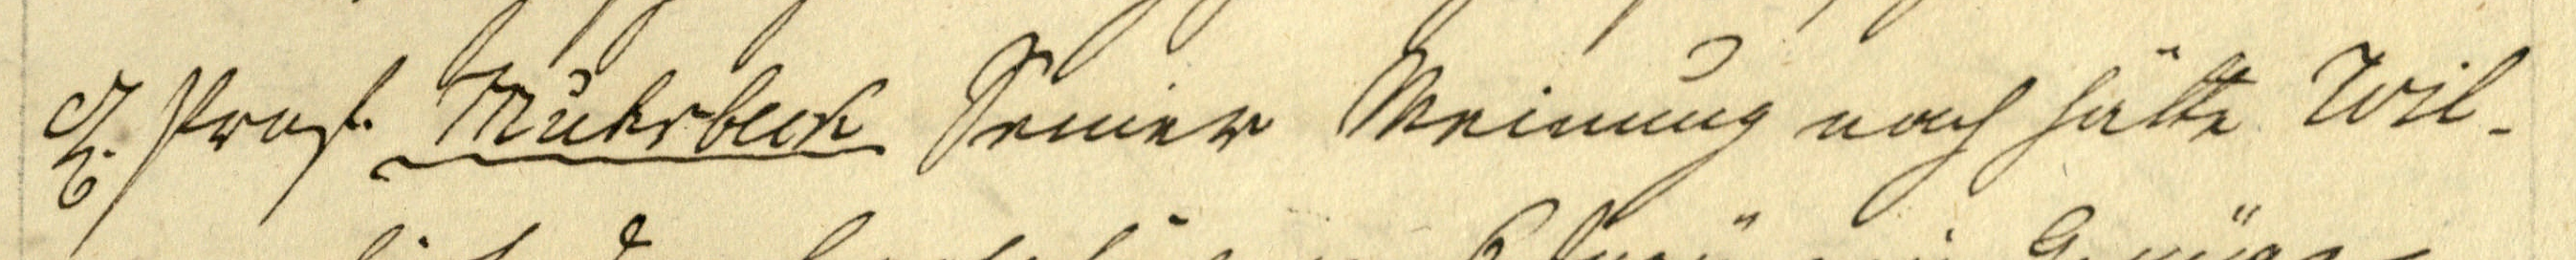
dh. Prof. Muhrbeck Seiner Meinung nach hätte Wil-
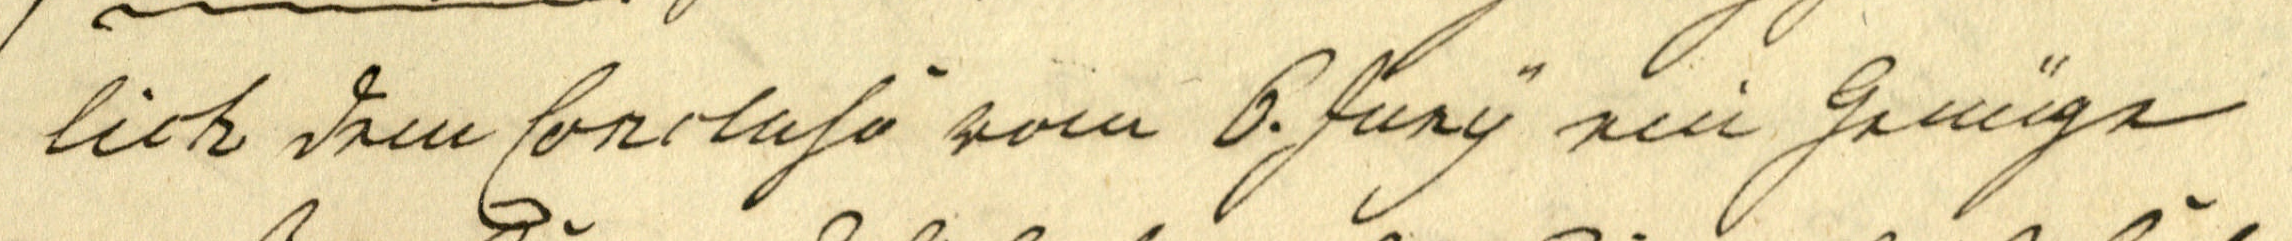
lich dem Concluso vom 6. Juny ein Genüge
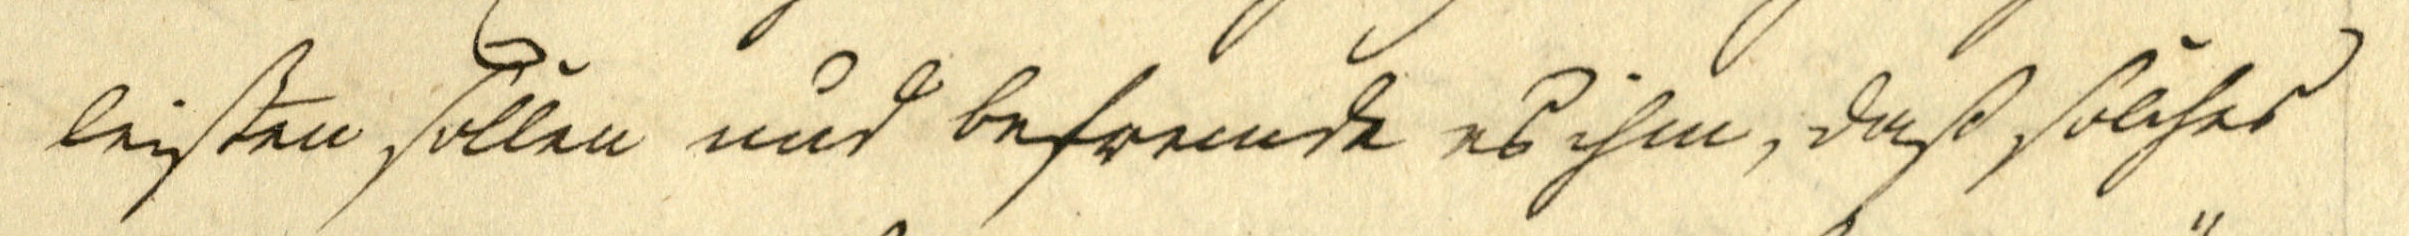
leisten sollen und befremde es ihm, daß solches
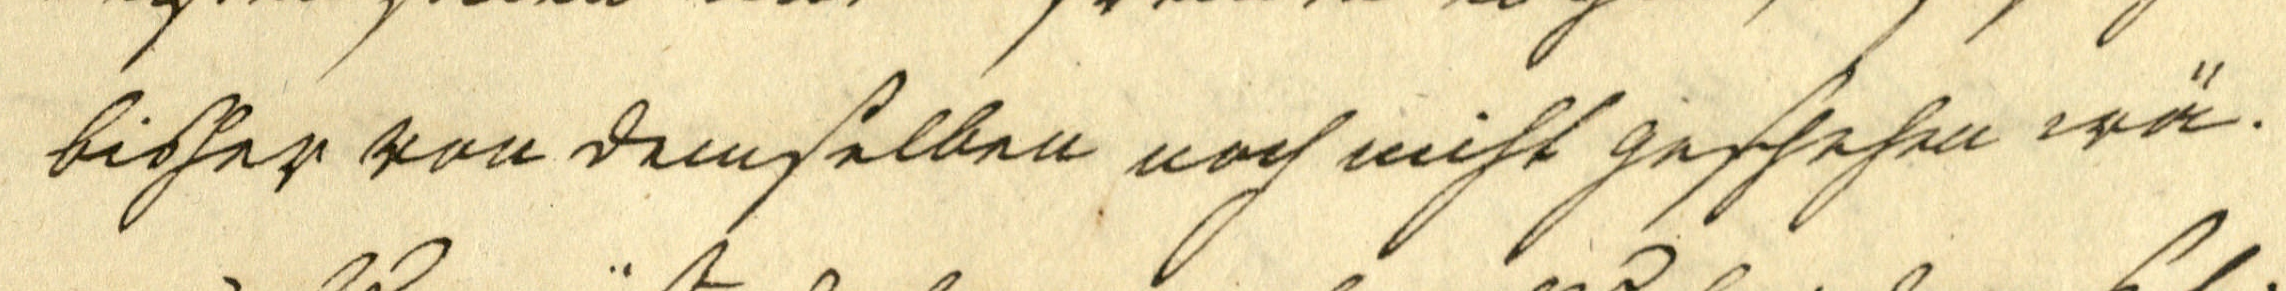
bisher von demselben noch nciht geschehen wä-
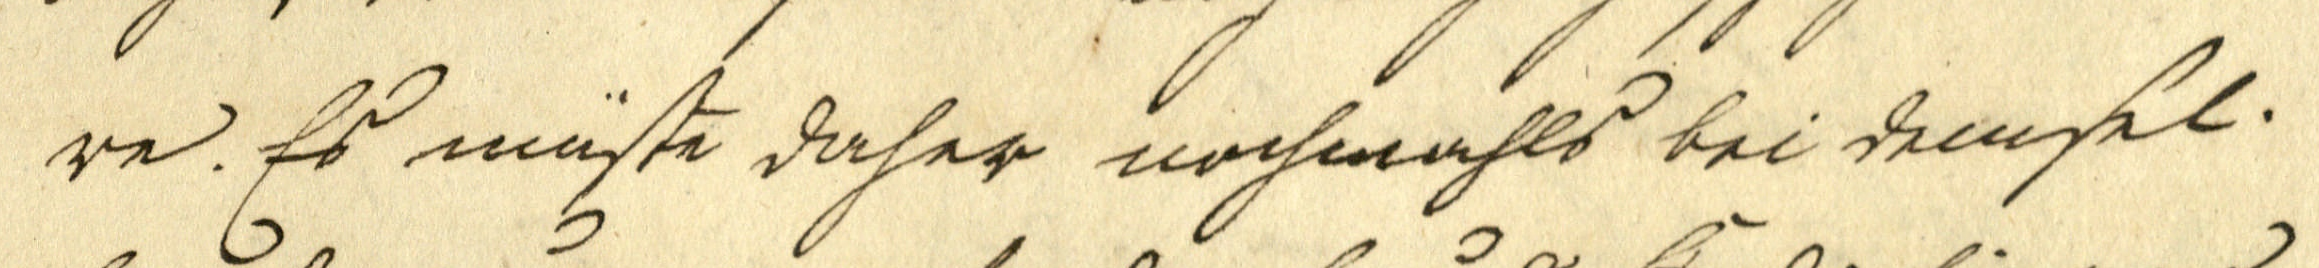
re. Es müßte daher nochmahls bei demsel-
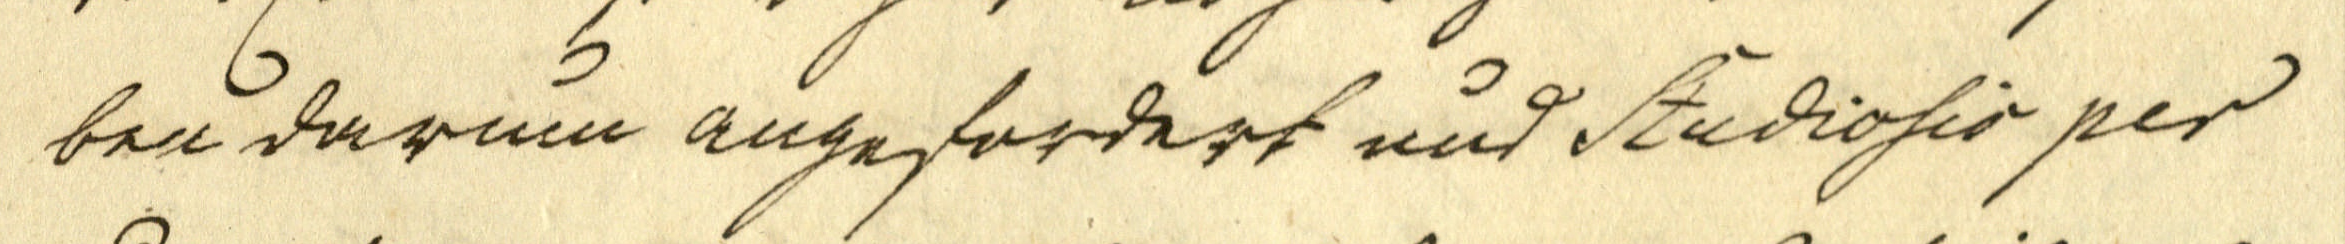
ben darum angefordert und Studiosis per
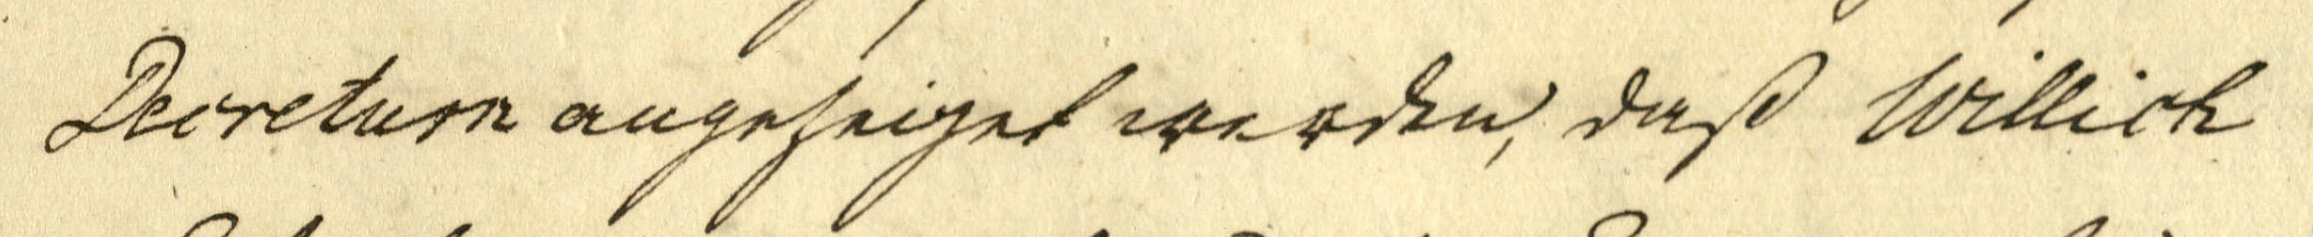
Decretum angezeiget werden, daß Willich
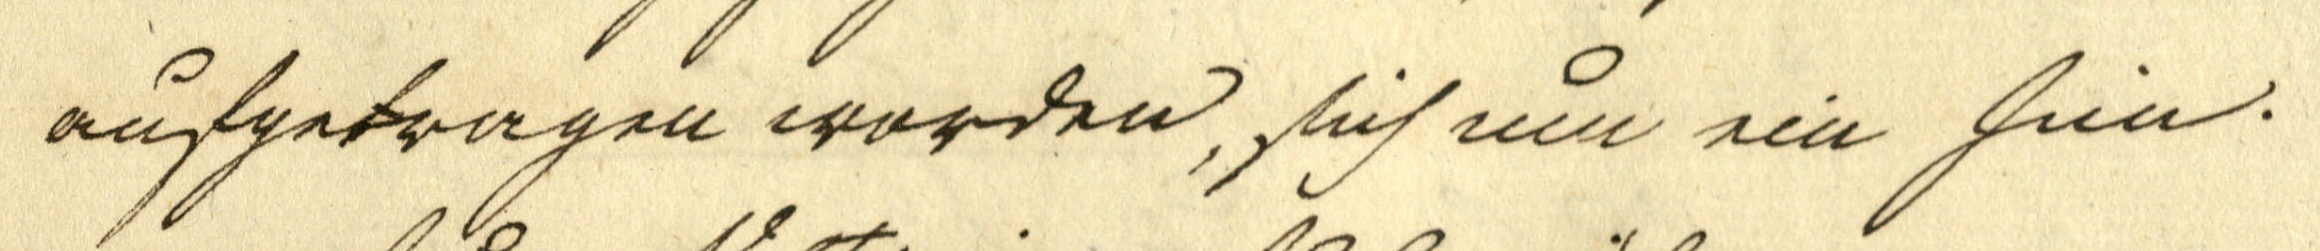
aufgetragen worden, sich um ein Zim-
